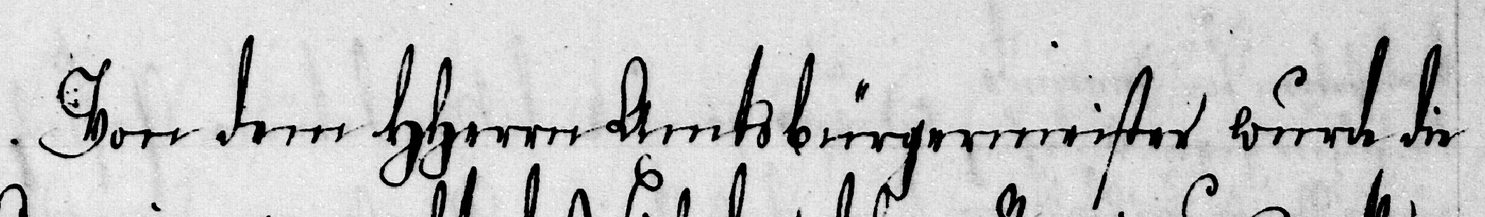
Von dem HHerrn Amtsbürgermeister wurde die
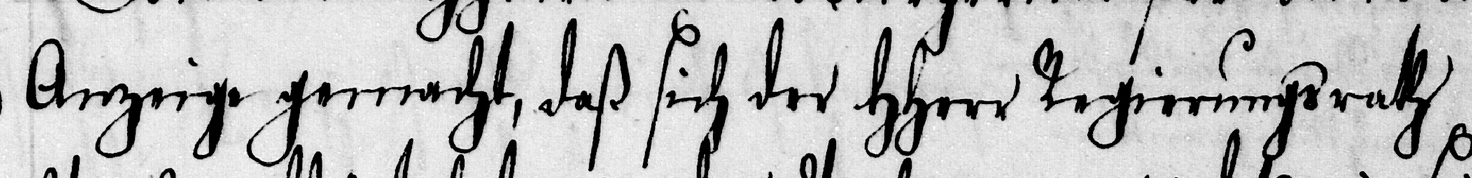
Anzeige gemacht, daß sich der HHerr Regierungsrath
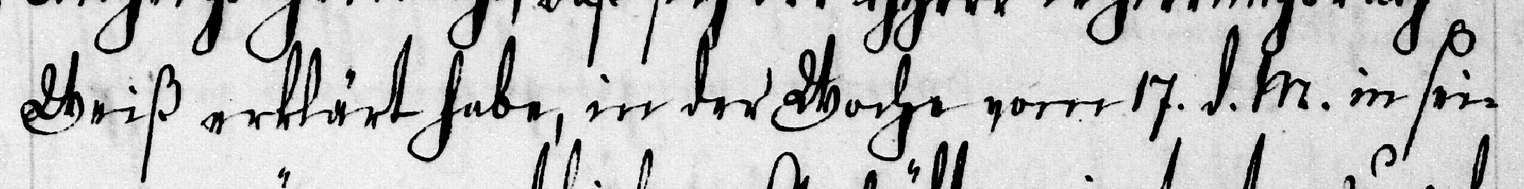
Weiß erklärt habe, in der Woche vom 17. d. M. in sei¬
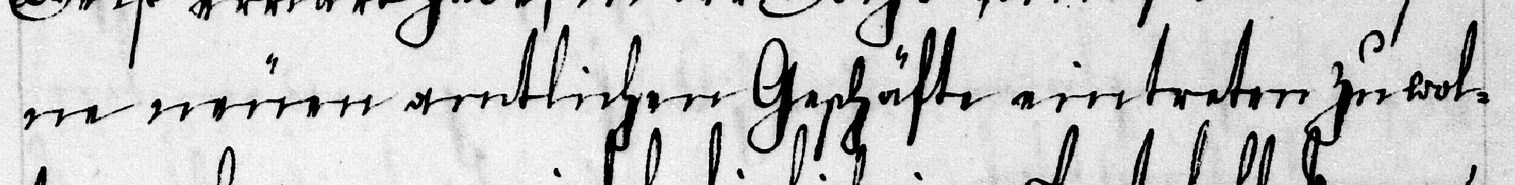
ne neuen amtlichen Geschäfte eintreten zu wol¬
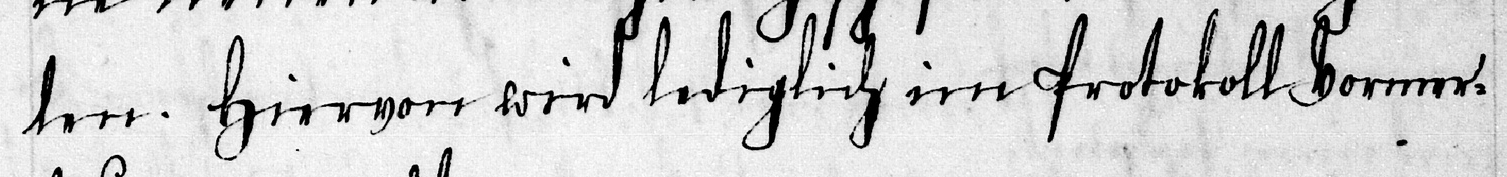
len. Hiervon wird lediglich im Protokoll Vormer¬
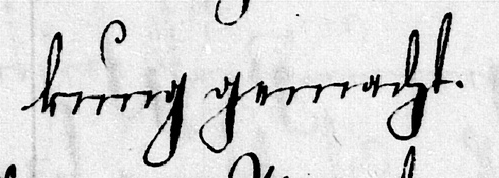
kung gemacht.
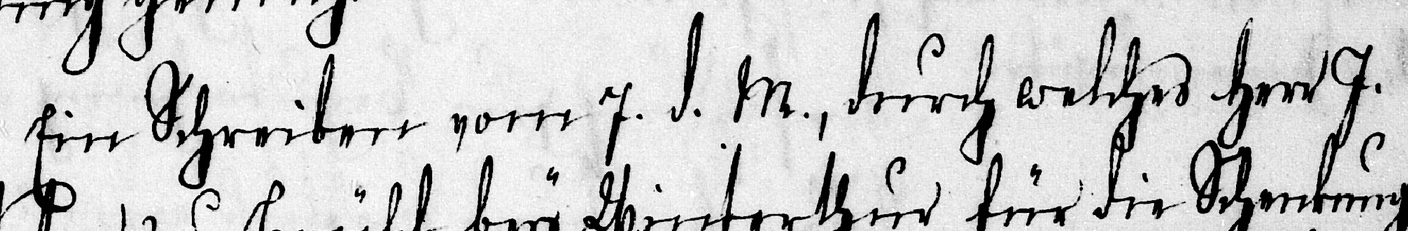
Ein Schreiben vom 7. d. M., durch welches Herr J.
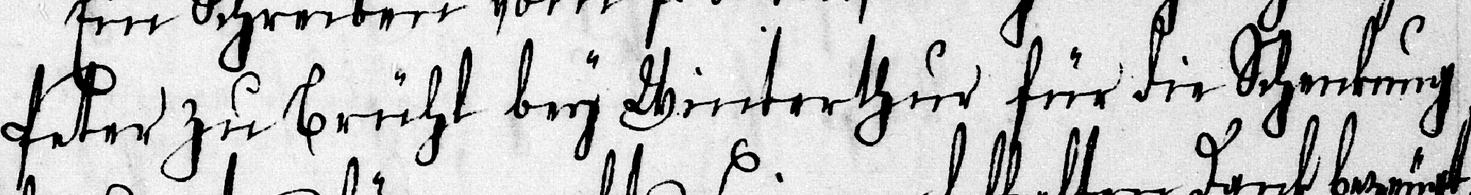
Peter zu Brühl bey Winterthur für die Schenkung
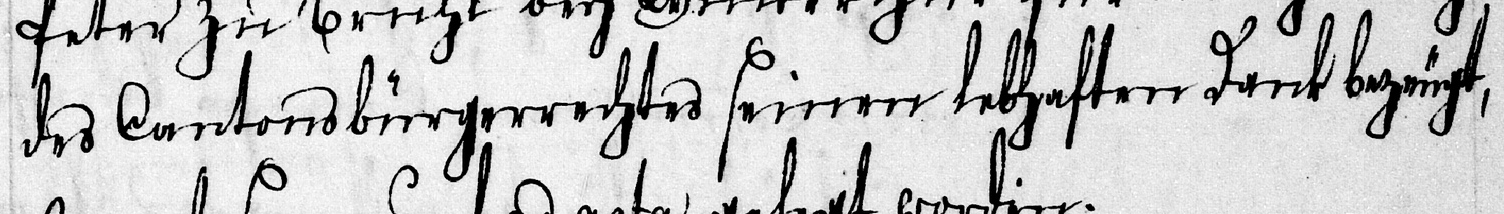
des Cantonsbürgerrechtes seinen lebhaften Dank bezeugt,
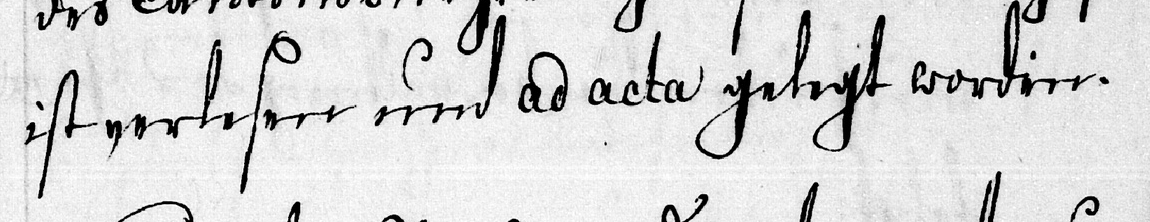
ist verlesen und ad acta gelegt worden.
